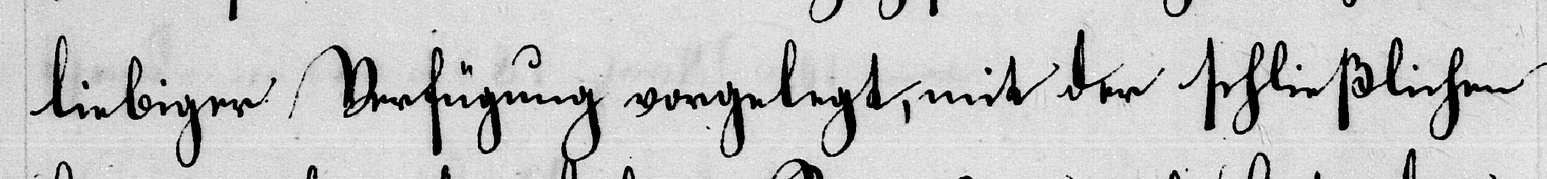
liebiger Verfügung vorgelegt, mit der schließlichen
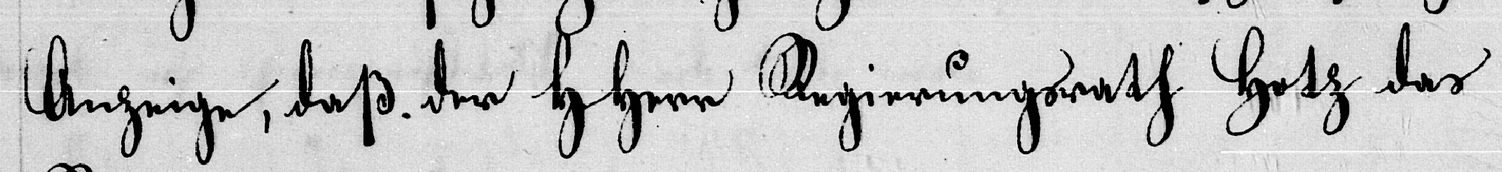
Anzeige, daß der HHerr Regierungsrath Hotz das
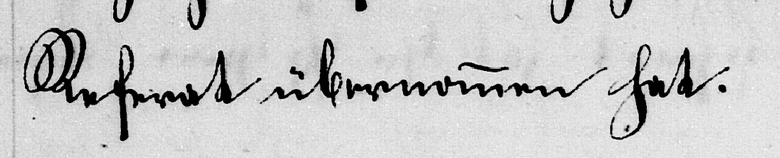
Referat übernommen hat.
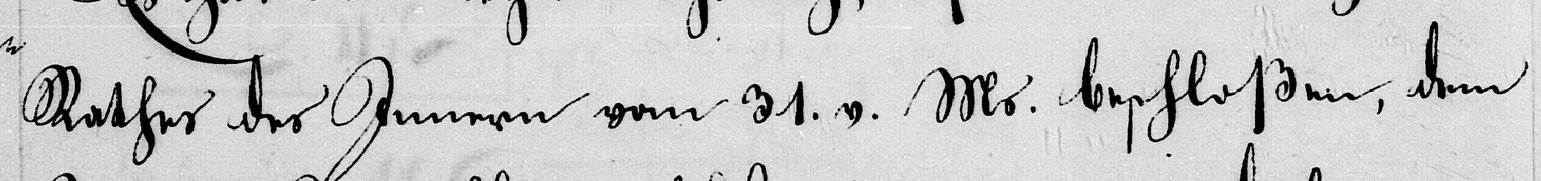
Rathes des Innern vom 31. v. Ms. beschloßen, dem
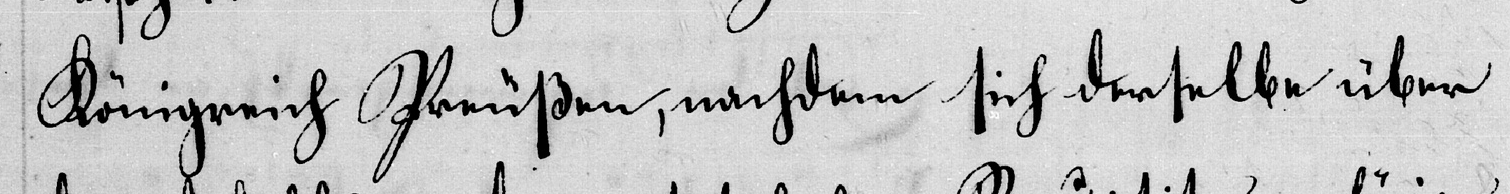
Königreich Preußen, nachdem sich derselbe über
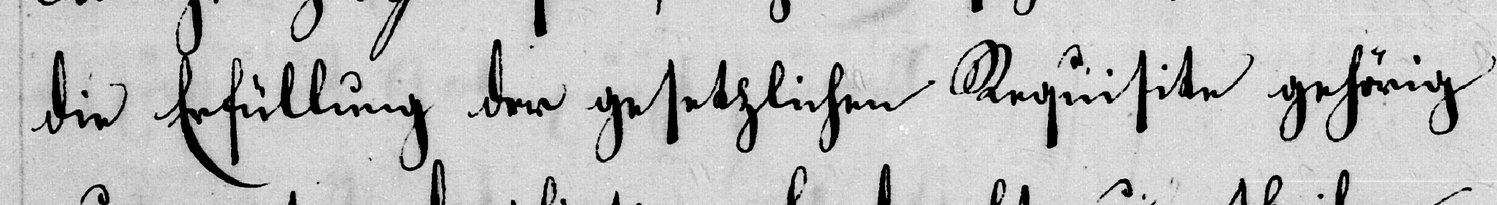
die Erfüllung der gesetzlichen Requisiten gehörig
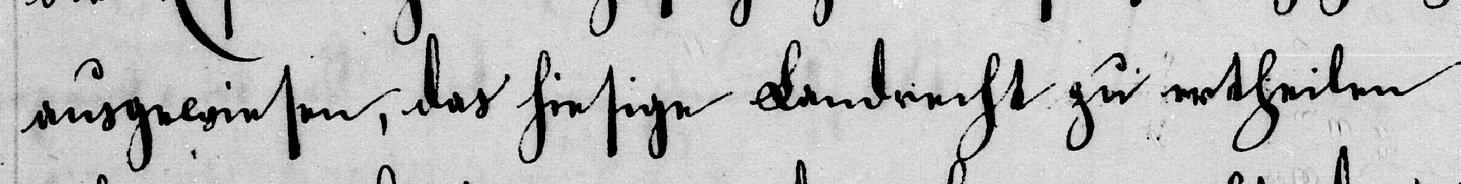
ausgewiesen, das hiesige Landrecht zu ertheilen
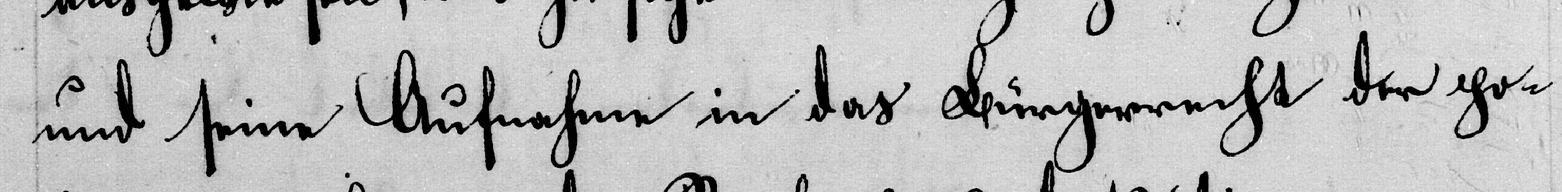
und seine Aufnahme in das Bürgerrecht der po¬
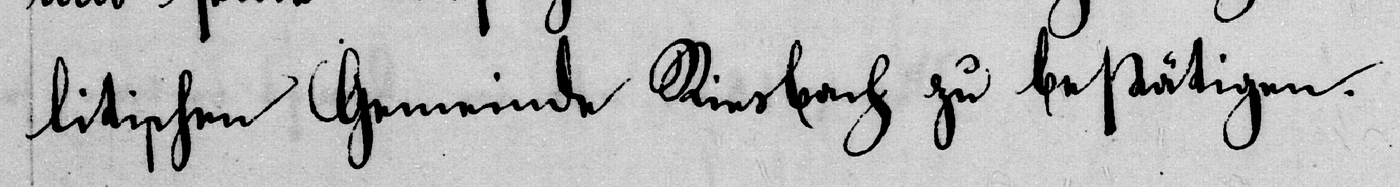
litischen Gemeinde Riesbach zu bestätigen.
